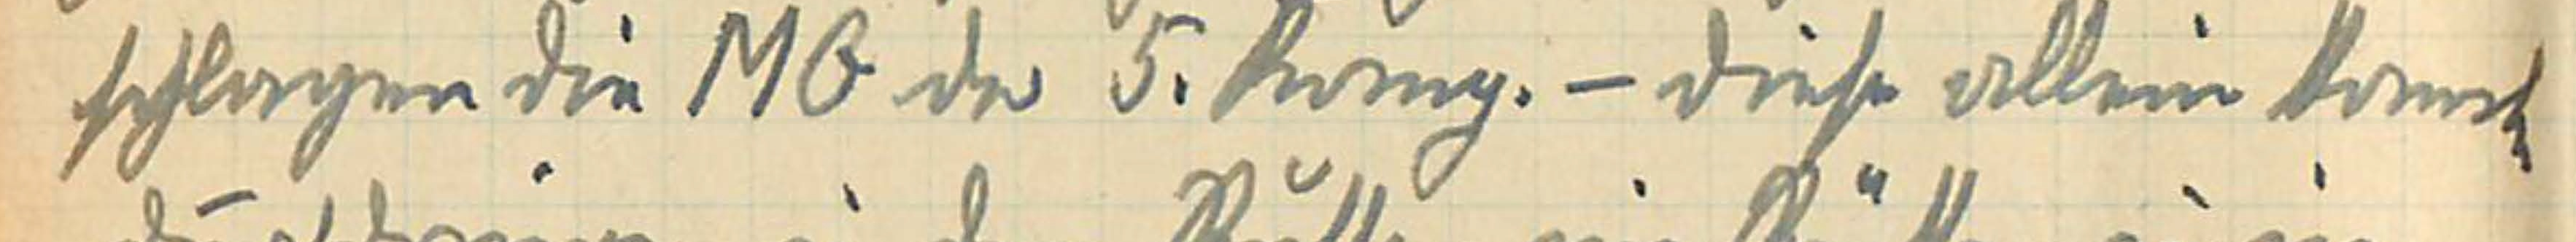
schlagen die MG der 5. Komp. – diese allein konnten
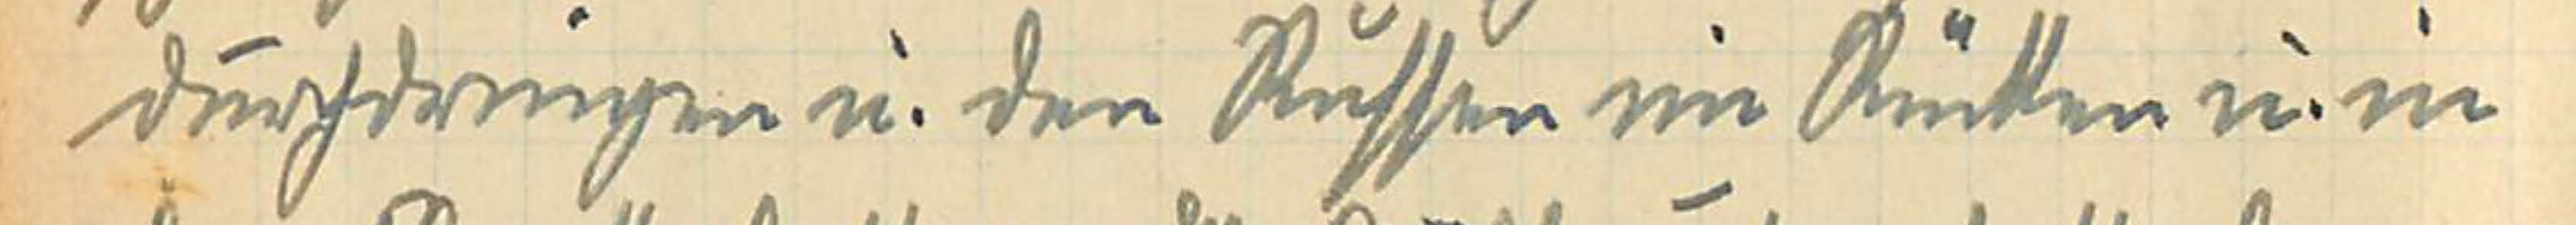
durchdringen u. den Russen im Rücken u. in
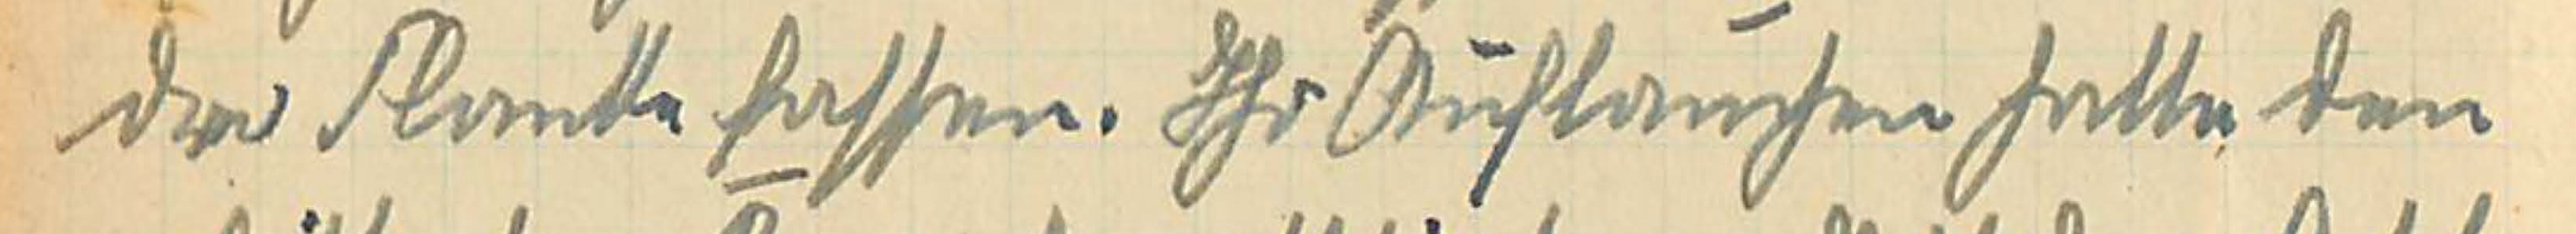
der Flanke fassen. Ihr Auftauchen hatte den
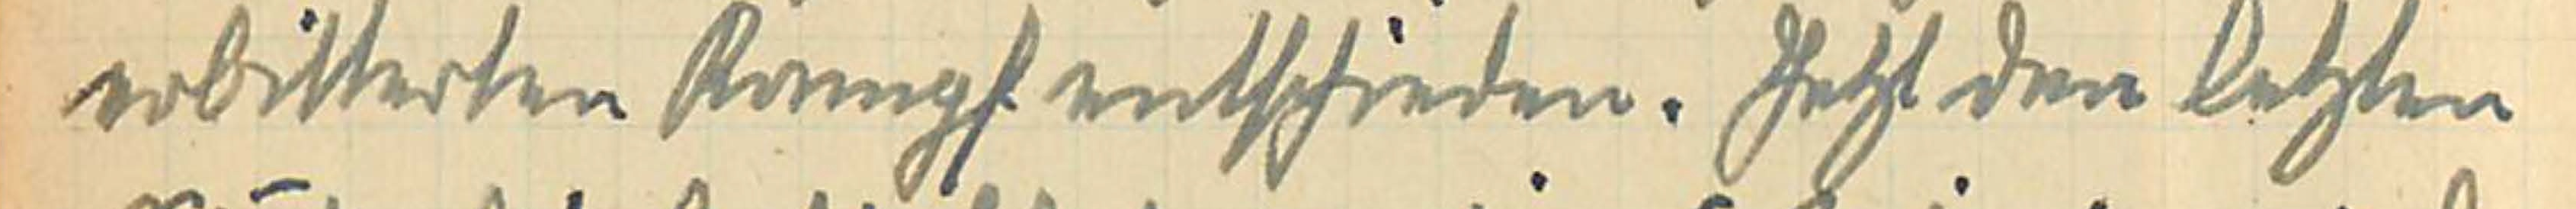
erbitterten Kampf entschieden. Jetzt den letzten
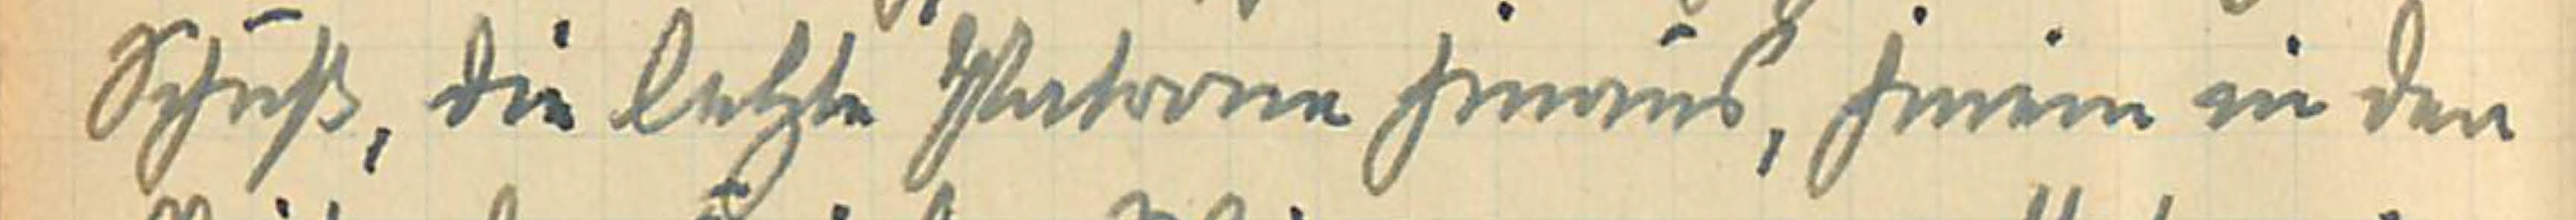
Schuß, die letzte Patrone hinaus, hinein in den
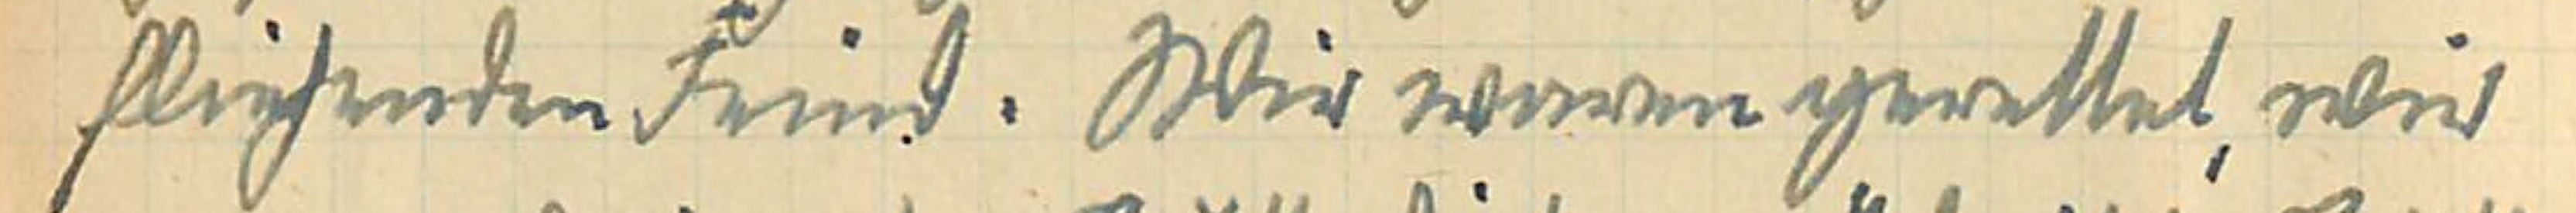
fliehenden Feind. Wir waren gerettet, wir
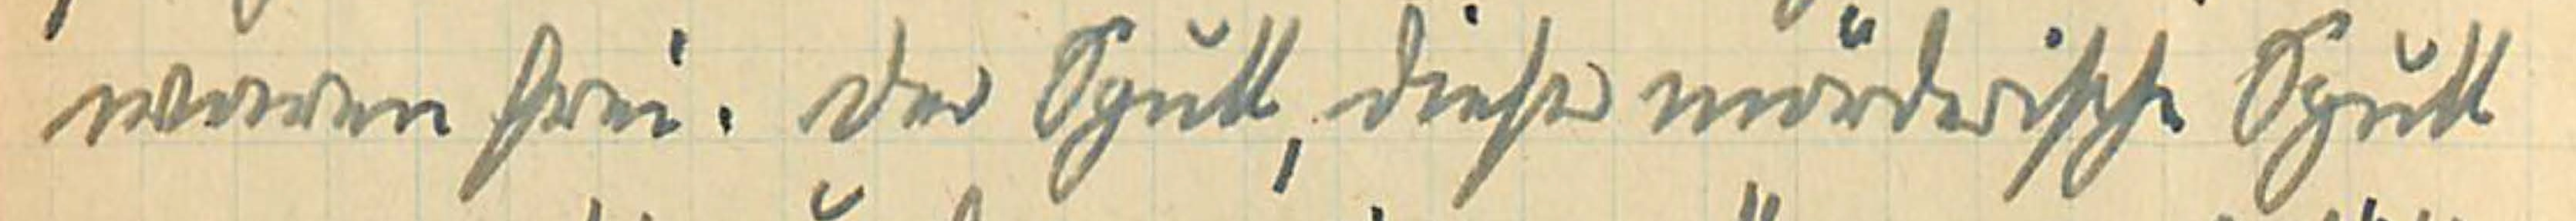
waren frei. Der Spuk, dieser mörderische Spuk
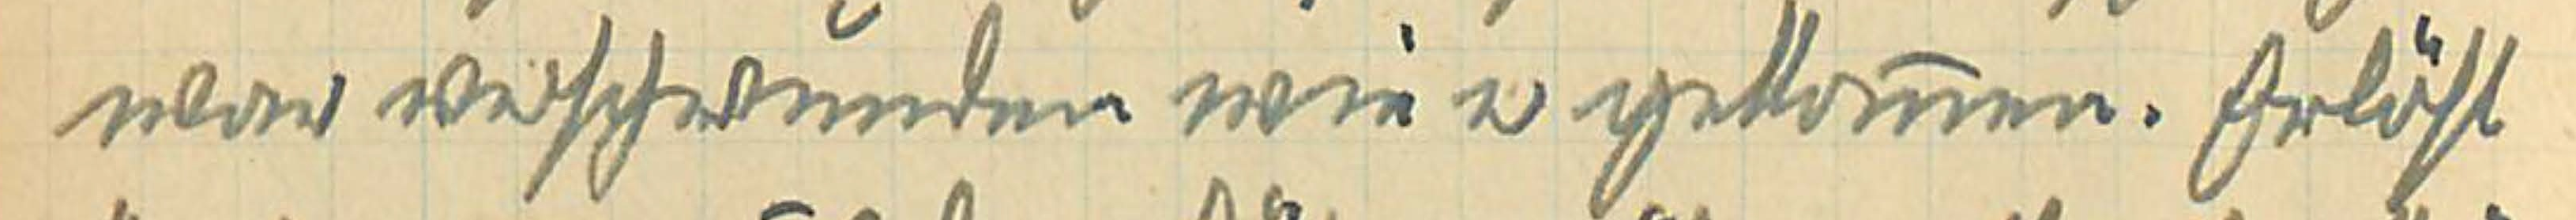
war verschwunden wie er gekommen. Erlöst
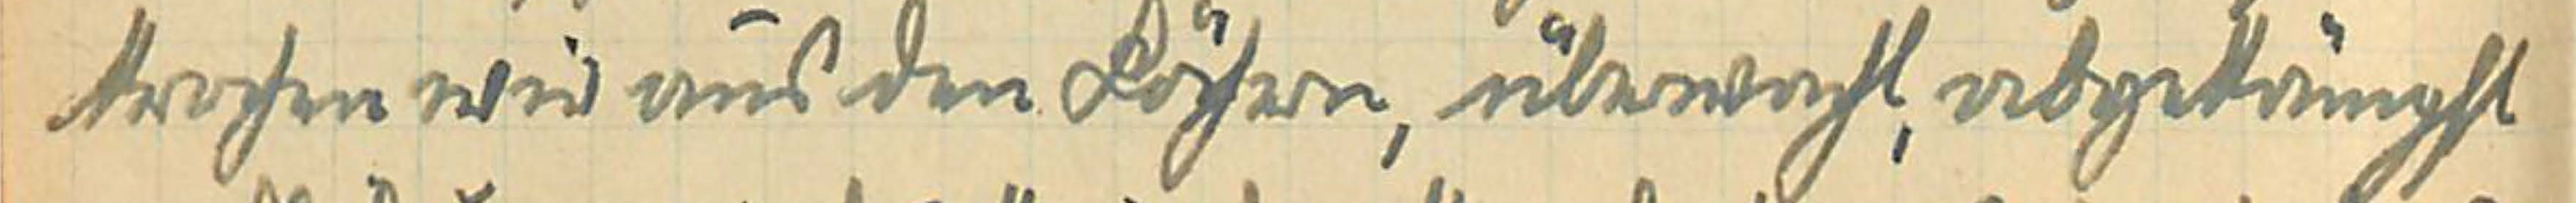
krochen wir aus den Löchern, überwacht, abgekämpft
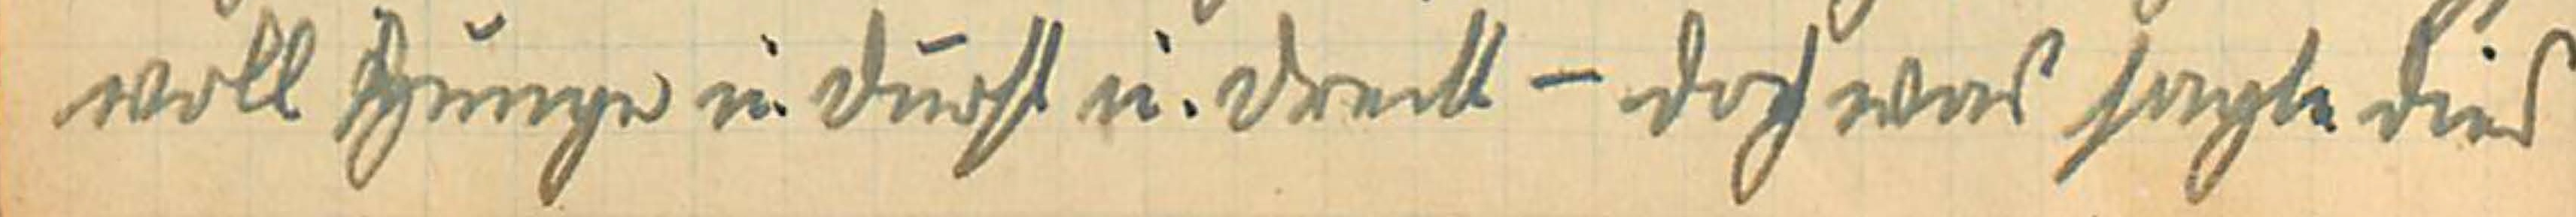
voll Hunger u. Durst u. Dreck – doch was sagte dies
